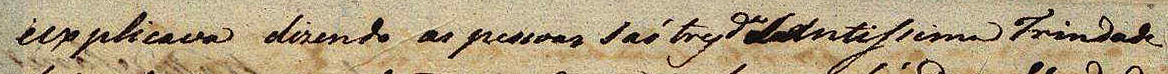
e explicava, dizendo as pessoas saõ tres da Santissima Trindade
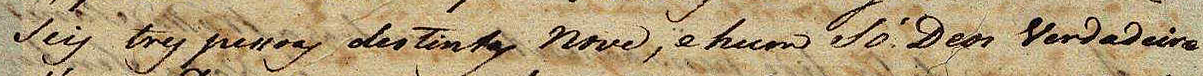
seis tres pessoas destintas nove, e hum só Deos Verdadeiro
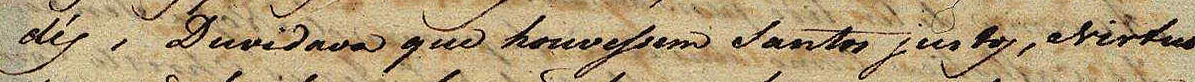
dés, Duvidava que houvessem santos justos, e virtuo
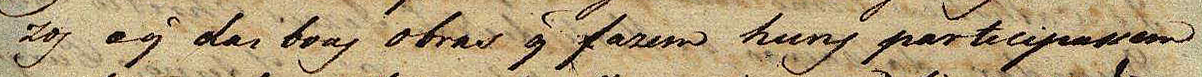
zos o q̄ das boas obras q̄ fazem huns partecipassem
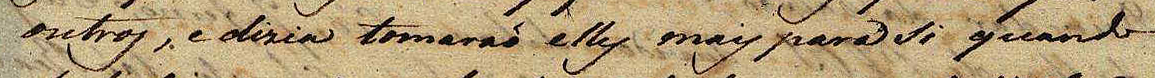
outros, e dizia tomaraõ elles mais para si quando
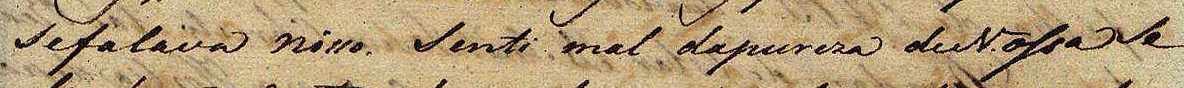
se falava nisso. Senti mal da pureza de Nossa Se
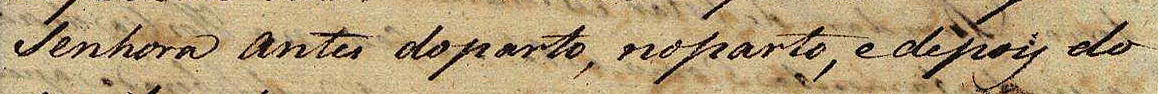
Senhora antes do parto, no parto, e depois do
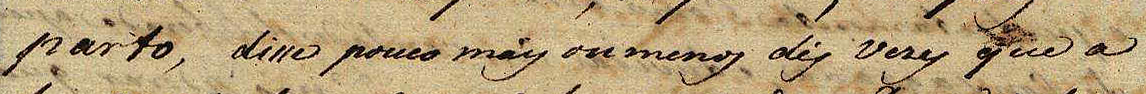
parto, disse pouco mais ou menos des vezes que a
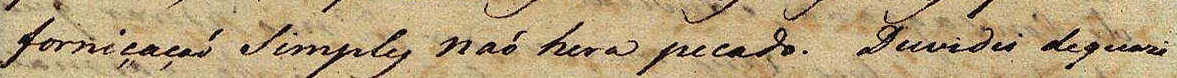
forniçaçaõ simples naõ hera pecado. Duvidei de quazi
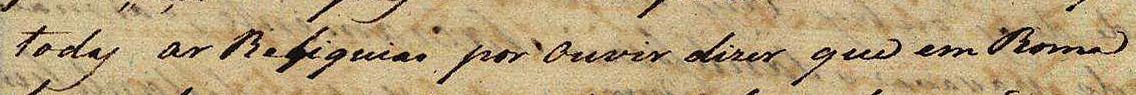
todas as Reliquias por ouvir dizer que em Roma
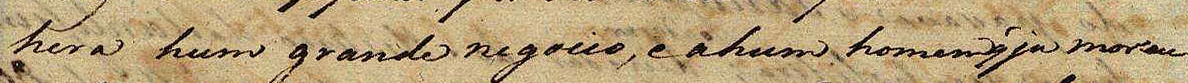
hera hum grande negocio, e a hum homem̄ q̄ ja moreu
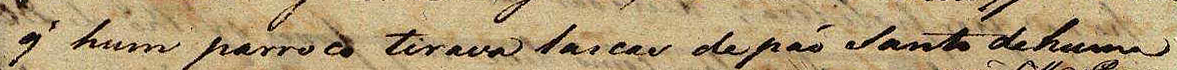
q̄ hum parroco tirava lascas de paó santo de huma
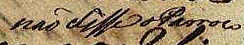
naõ disse o Parroco
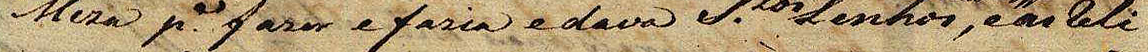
Meza p.a fazer e fazia e dava S.tos Lenhos, e as Reli
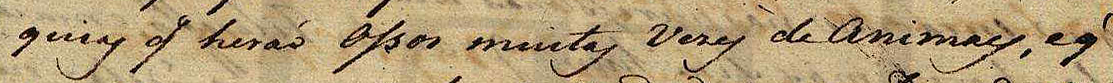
quias q̄ heraõ ossos muitas vezes de animaes, e q̄
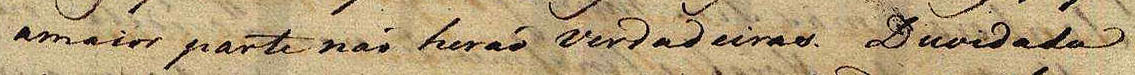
a maior parte não herão verdadeiras. Duvidada
